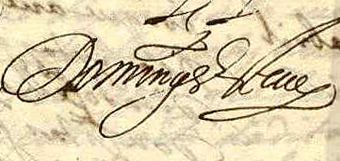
Domingos esteues
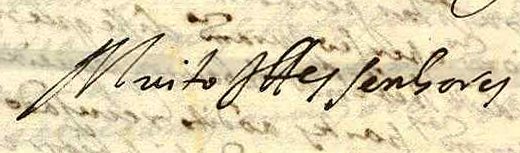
Muito Jlles Senhores
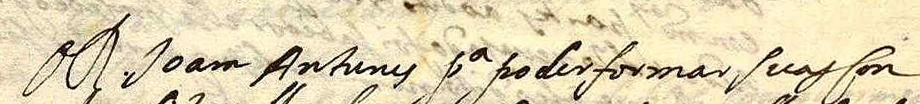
O R. Joam Antunes pa poder formar suas Con
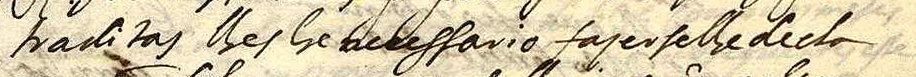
traditas lhes he necessario fazerselhe decla
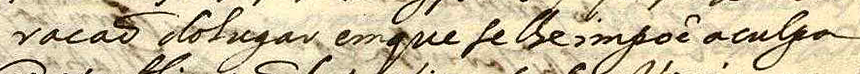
raçaõ do lugar em que se lhe impoē a culpa
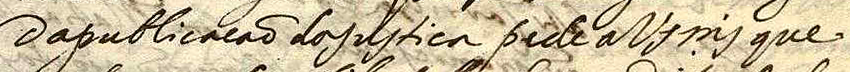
da publicaçaõ da justiça pede a Vs m̄s que
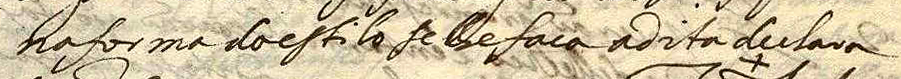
na forma do estilo se lhe faça a dita declara
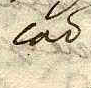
çaõ
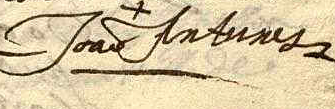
Joaõ Antunes
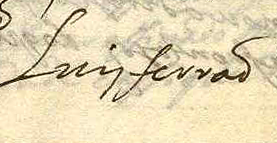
Luis ferraõ
